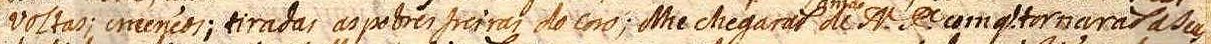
voltas; e menēos, tiradas as pobres freiras do coro; e lhe chegaraõ de N. P.e com q̄. tornaraõ a seus
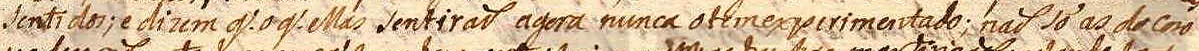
sentidos; e dizem q̄. o q̄. ellas sentiraõ agora nunca o tem experimentado; naõ só as do coro
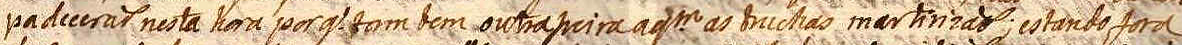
padeçeraõ nesta hora porq̄. tambem outra freira a q.m as bruchas martirizaõ; estando fora
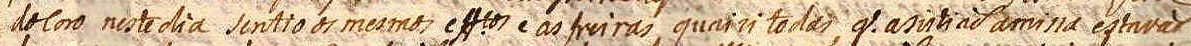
do coro neste dia sentio os mesmos eff.tos e as freiras quaisi todas q̄. asistiaõ a missa estavaõ
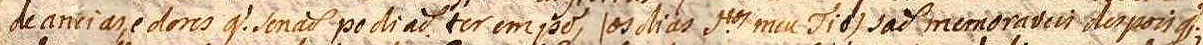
de ancias e dores q̄. se naõ podiaõ ter em pé, / os dias S.tos meu Tio / saõ memoraveis despois q̄.
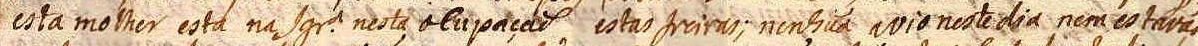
esta molher esta na Igr.a nesta ocupaçaõ estas freiras, nenhuā a vio neste dia, nem estavaõ
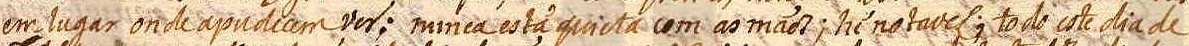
em lugar onde a pudecem ver; nunca está quieta com as maõs; hé notavel; todo este dia de
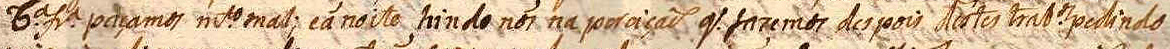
6.a fr.a paçamos m.to mal; e á noite hindo nós na porciçaõ q̄ fazemos despois destes trab.oz pedindo
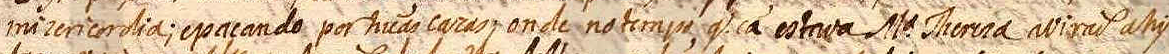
misericordia; e pacando por huās cazas, onde no tempo q̄. cá estava M.a Thereza a viraõ ahy
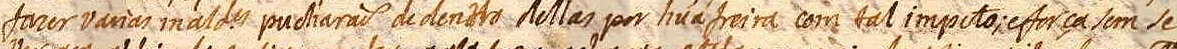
fazer varias mald.es pucharaõ de dentro dellas por huā freira com tal impito; e força sem se
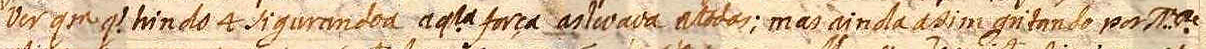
ver qm q̄. hindo 4 sigurandoa aq.la força as levava a todos; mas ainda asim gritando por N. Pe.
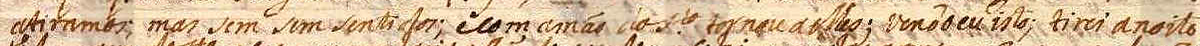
a tiramos; mas sem sem sentidos; e com a mão do s.to tornou a elles; vendo eu isto; tirei a noite
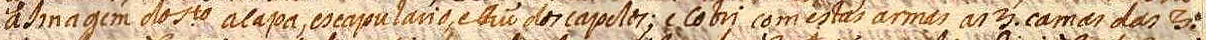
a Imagem do S.to a capa, escapulario, e hū dos capelos; cobri com estas armas as 3 camas das 3.
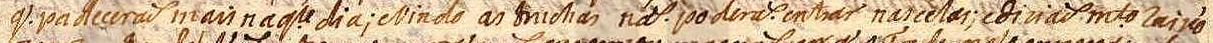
q̄. padeceraõ mais naq.le dia; e vindo as bruchas, naõ poderaõ entrar nas celas; e diziaõ mto Raivo
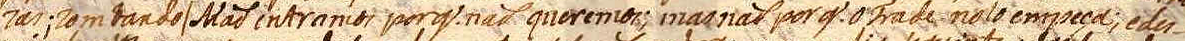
zas; zombando / Naõ entramos porq̄. naõ queremos; mas naõ porq̄. o Frade nos o empeça; e des
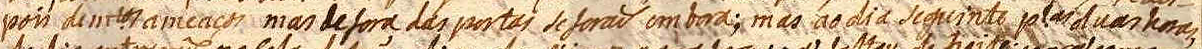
pois de mtos ameaços mas de fora das portas se foraõ embora; mas ao dia seguinte p.las duas horas
